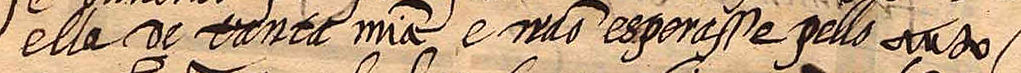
ella de tanta mīa e naõ esperasse pello auto /
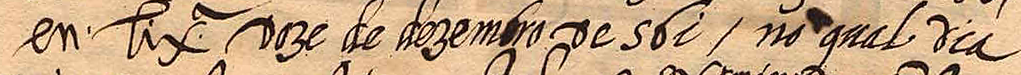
en lixa Doze de dezembro de 56i / no quaL dia
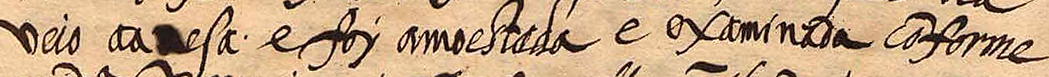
veio aa mesa e foy amoestada e examinada cōforme
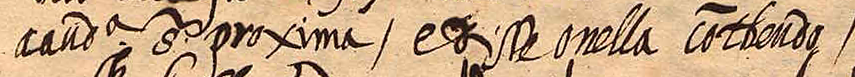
a auda. s̄. proxima / e disse o nella cōtheudo /
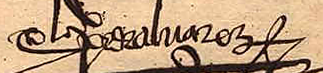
Ldo pedraluarez
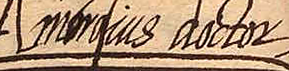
Ambrosius doctor
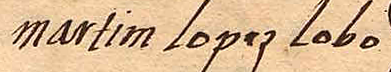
martim Lopez Lobo
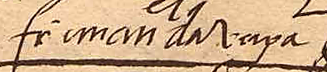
fr̄ emanel da veiga
